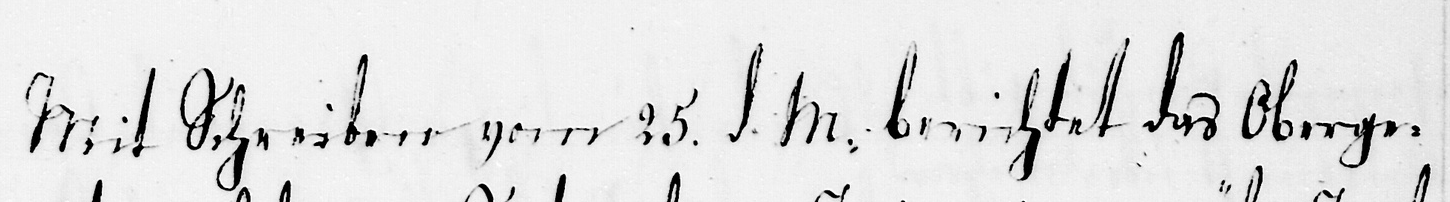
Mit Schreiben vom 25. d. M. berichtet das Oberge¬
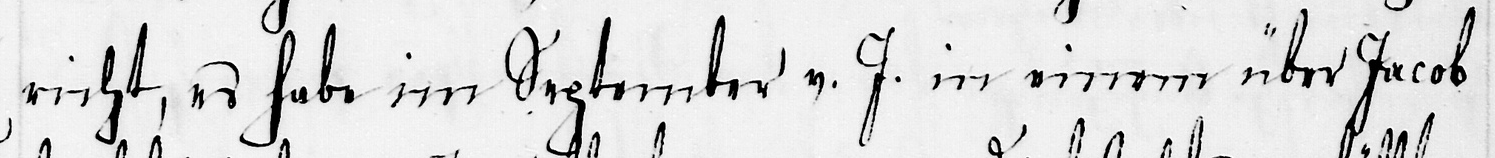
richt, es habe im September v. J. in einem über Jacob
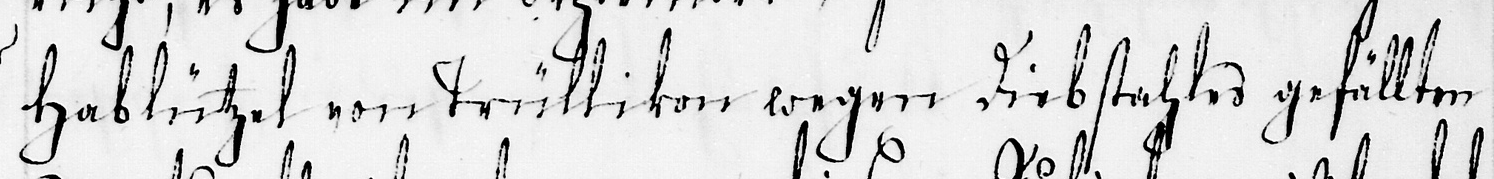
Hablützel von Trüllikon wegen Diebstahles gefällten
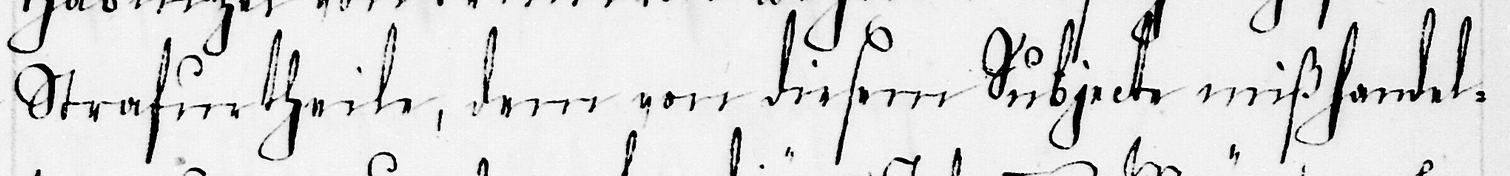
Strafurtheile, dem von diesem Subjecte mißhandel¬
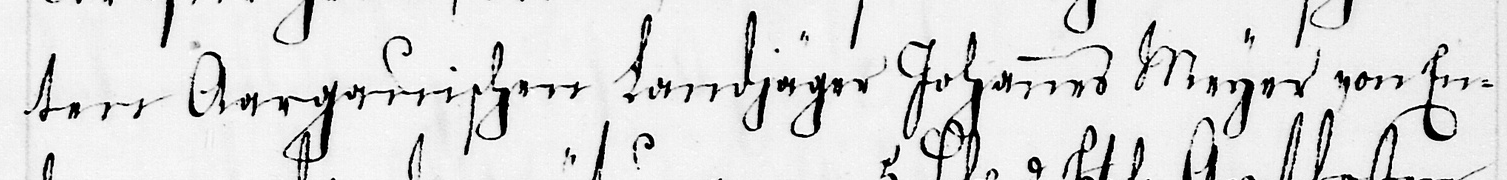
ten Aargauischen Landjäger Johannes Meyer von En¬
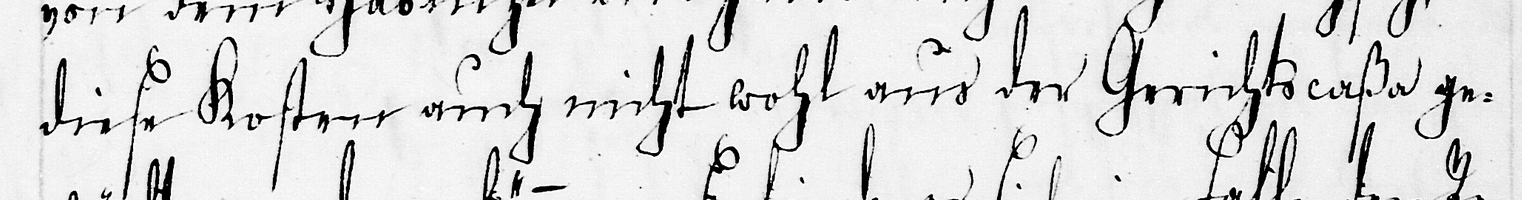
diese Kosten auch nicht wohl aus der Gerichtscaßa ges¬
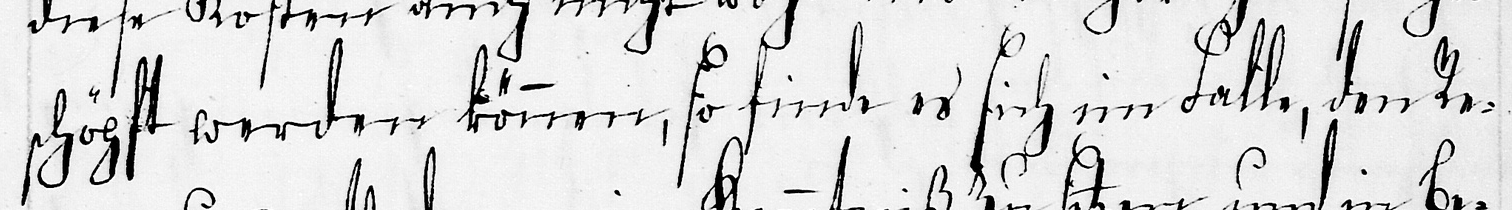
chöpft werden können, so finde es sich im Falle, den
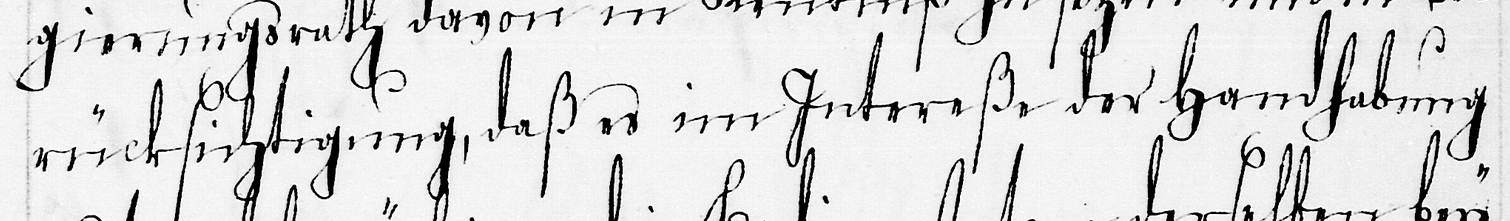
rücksichtigung, daß es im Intereße der Handhabung
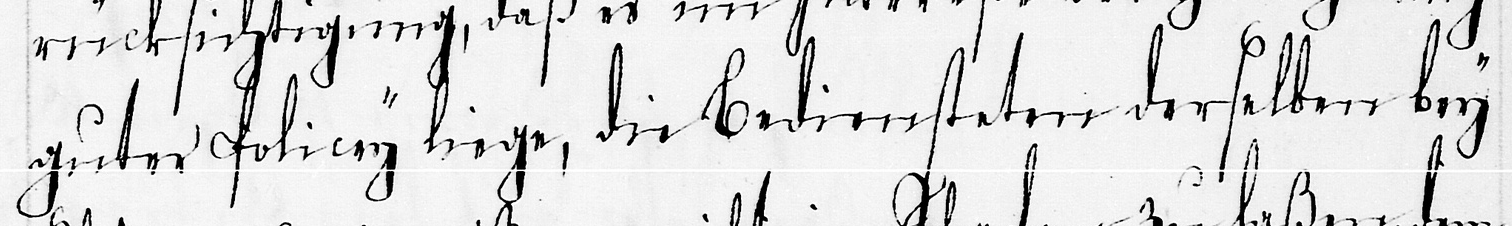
guter Policey liege, die Bediensteten derselben bey
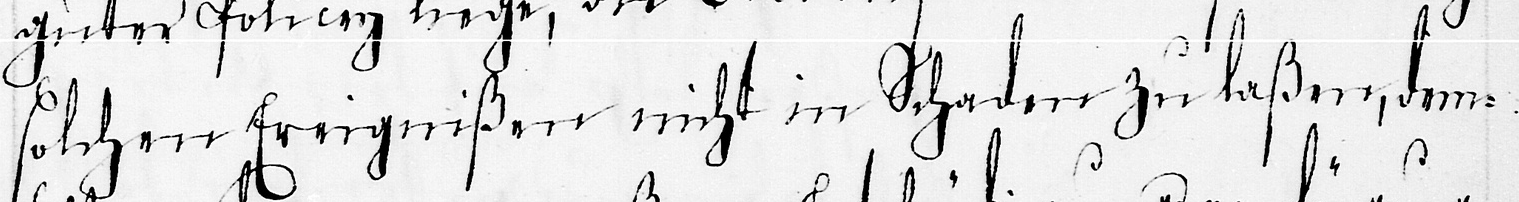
solchen Ereignißen nicht in Schaden zu laßen, dem¬
